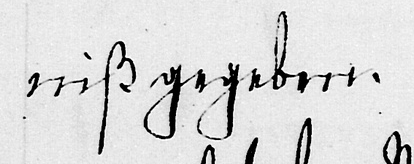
tniß gegeben.
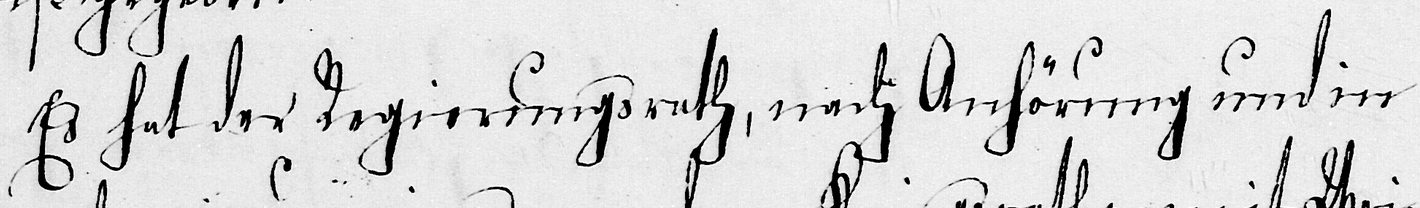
Es hat der Regierungsrath, nach Anhörung und in
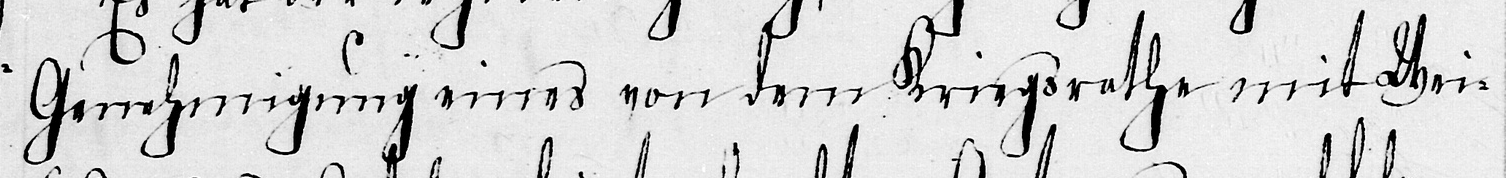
Genehmigung eines von dem Kriegsrathe mit Wei¬
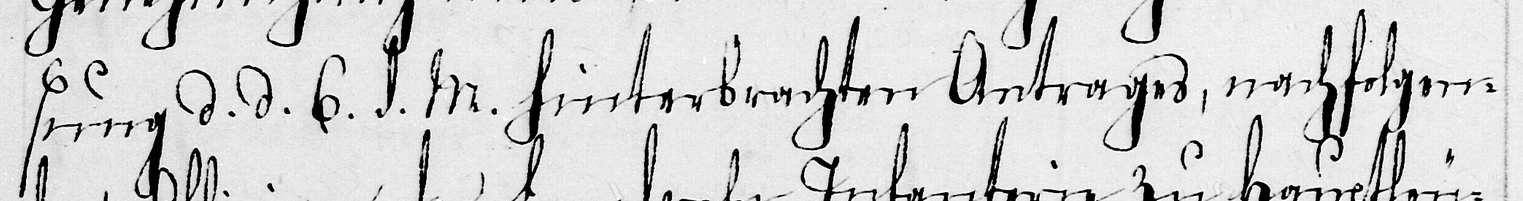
sung d. d. 6. d. M. hinterbrachten Antrages, nachfolgen¬
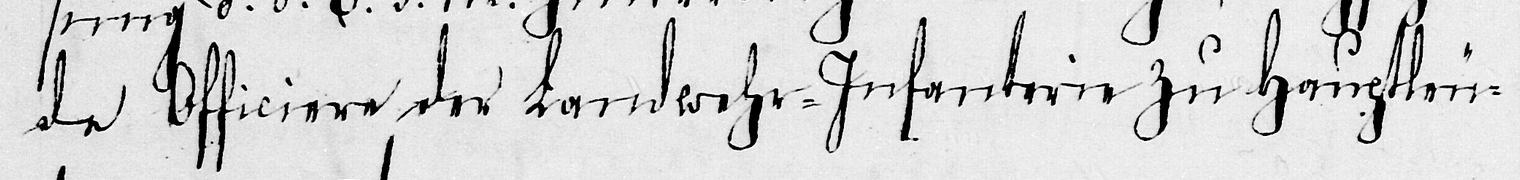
der Officiere der Landwehr-Infanterie zu Hauptleu¬
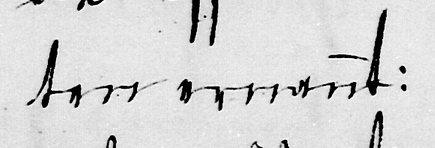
ten ernannt:
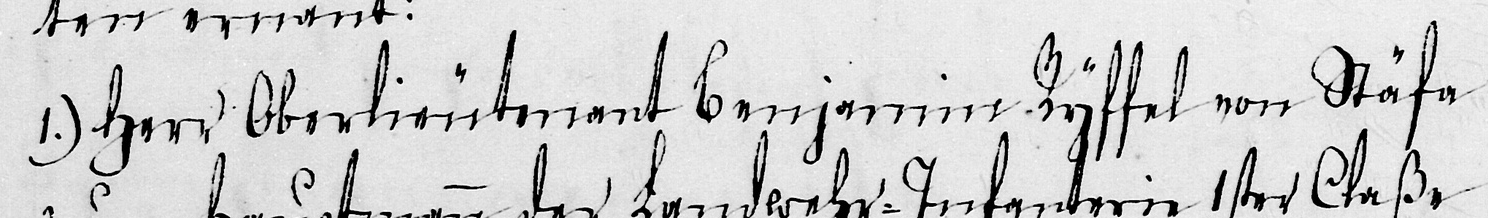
1.) Herr Oberlieutenant Benjamin Ryffel von Stäfa
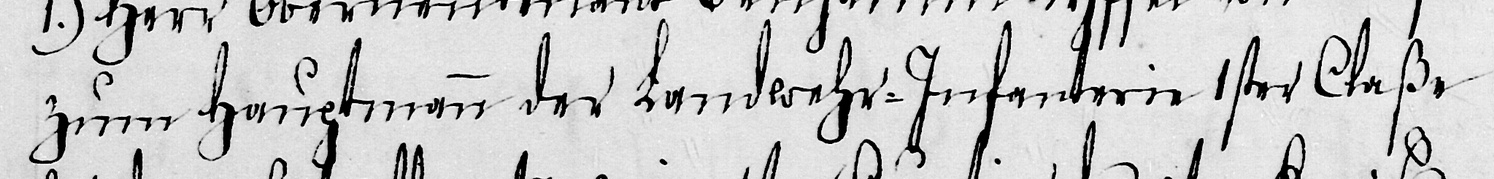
zum Hauptmann der Landwehr-Infanterie 1ster Claße
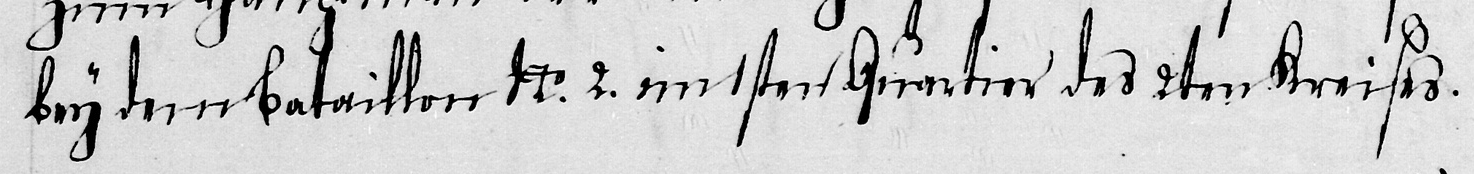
bey dem Bataillon No. 2. im 1sten Quartier des 2ten Kreises.
